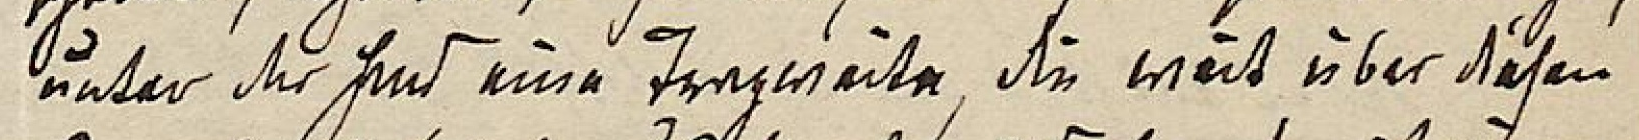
unter der Hand eine Tragweite, die weit über diesen
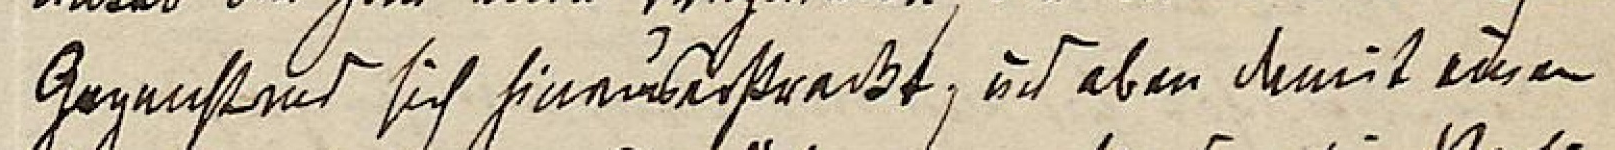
Gegenstand sich hinauserstrekt, und eben damit einen
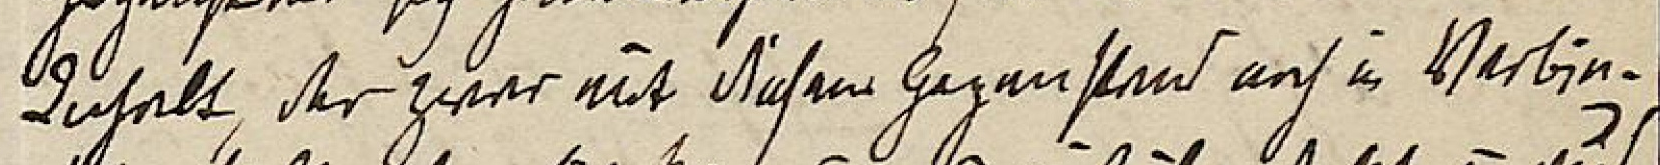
Inhalt, der zwar mit diesem Gegenstand noch in Verbin¬
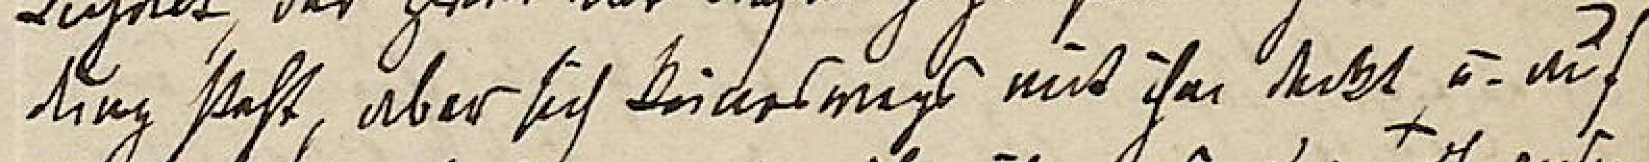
dung steht, aber sich keineswegs mit ihm deckt u. auf
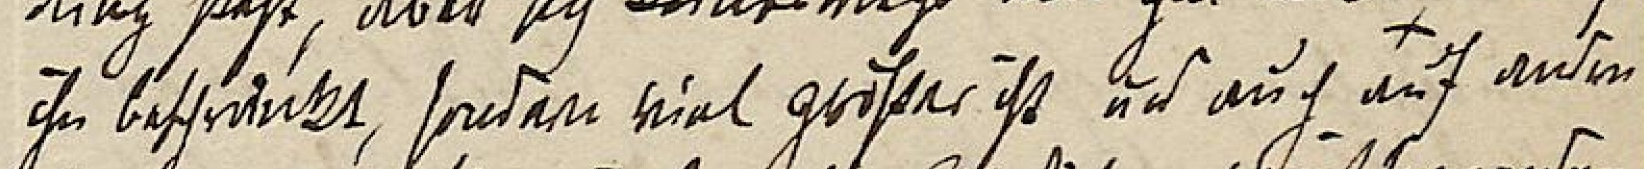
ihn beschränkt, sondern viel größer ist und auch auf andre
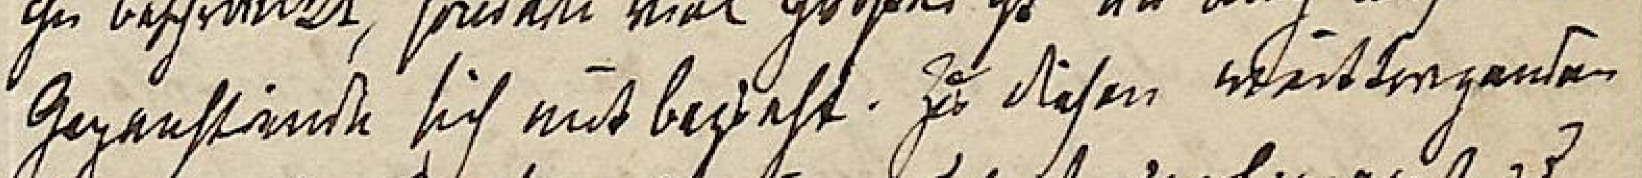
Gegenstände sich mit bezieht. Zu diesen weittragenden
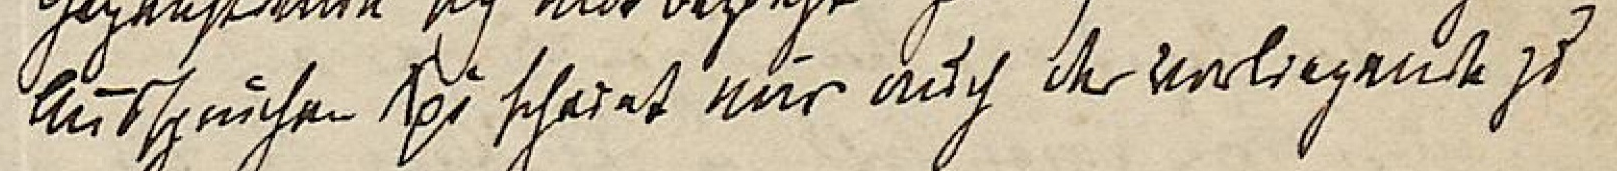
Aussprüchen Χρι scheint mir auch der vorliegend zu
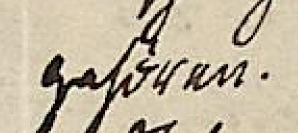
gehören.
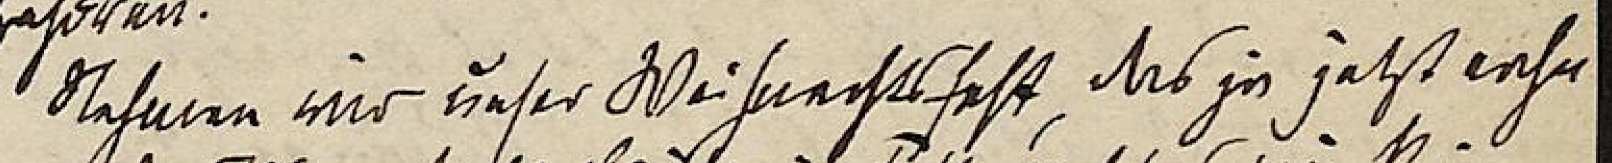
Nehmen wir unser Weihnachtsfest, das ja jetzt nahe
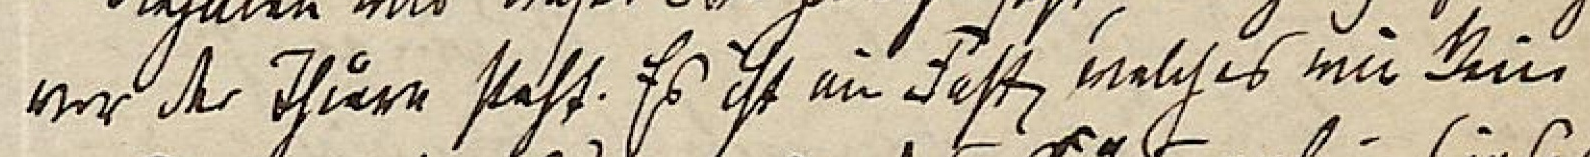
vor der Thüre steht. Es ist ein Fest, welches wie kein
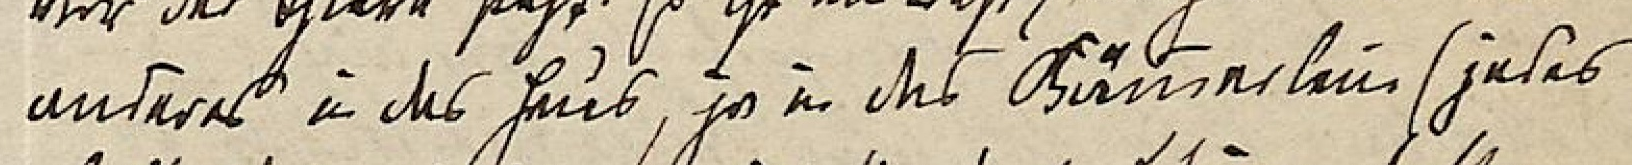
anderes in das Haus, ja in das Kämerlein (jedes
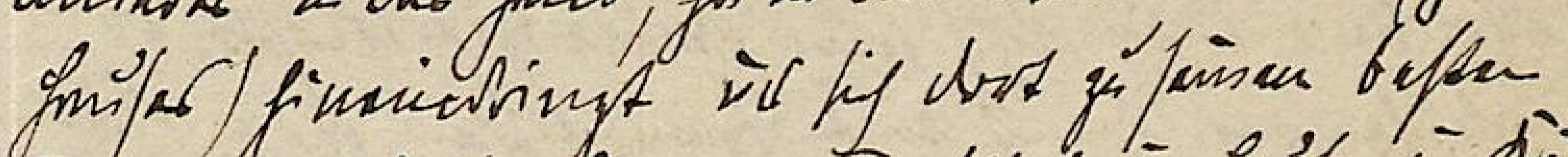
Hauses) hineindrinft und sich dort zu seinem besten
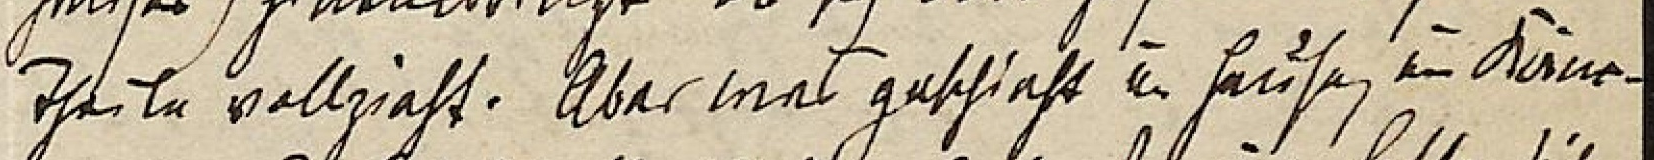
Theile vollzieht. Aber was geschieht im Hause, im Käm¬
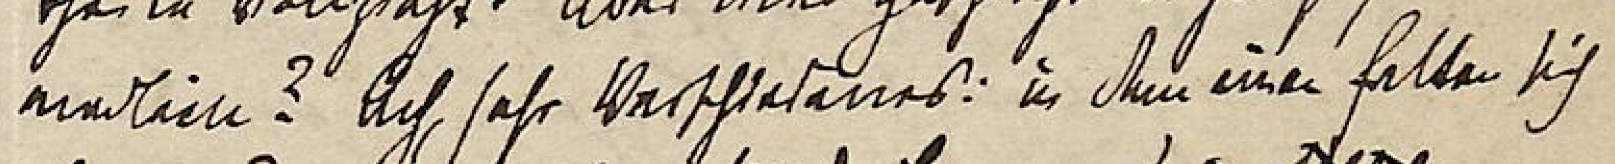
merlein? Ach, sehr Verschiedene: in dem einen halten sich
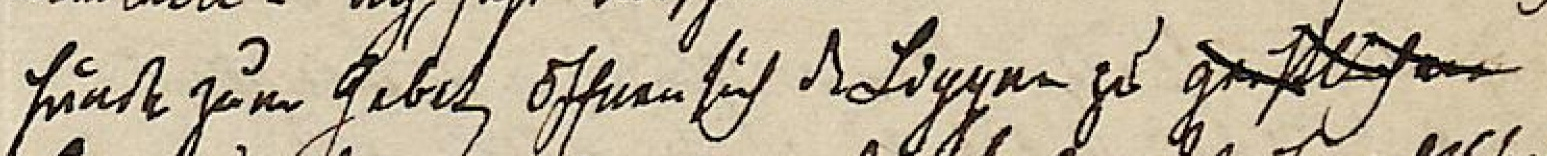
Hände zum Gebet, öffnen sich die Lippen zu geistlichem
